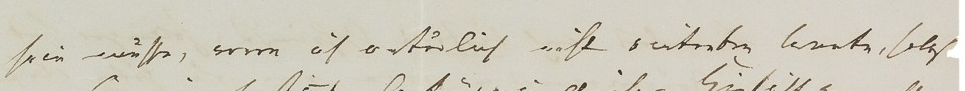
sein müsse, worin ich natürlich nicht eintreten konnte, bloß
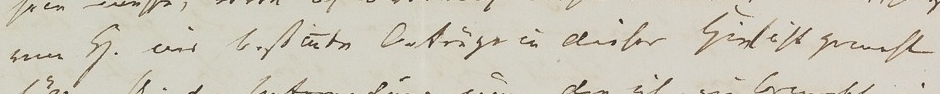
wenn H. mir bestimmte Anträge in dieser Hinsicht gemacht
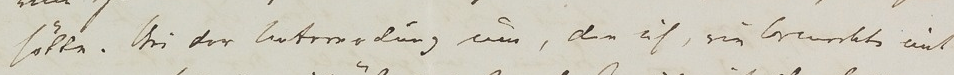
hätte. Bei der Unterredung nun, die ich, wie bemerkt, mit
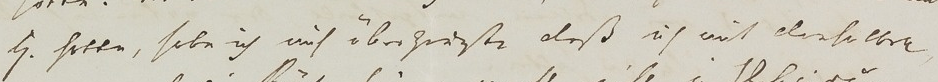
H. hatte, habe ich mich überzeugt, daß ich mit demselben,
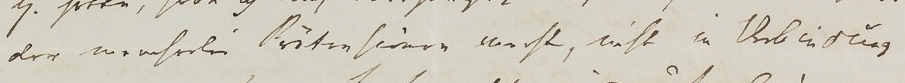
der mancherlei Prätensionen macht, nicht in Verbindung
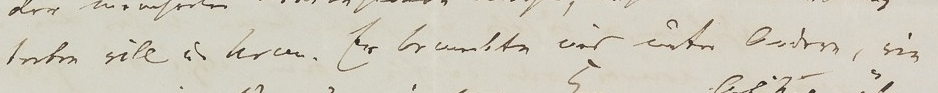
treten will u. kann. Er bemerkte mir unter Andern, wie
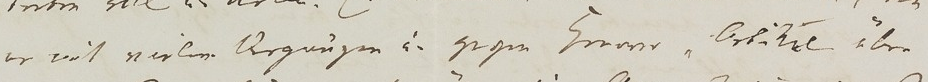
er mit vielem Vergnügen u. gegen Honorar «Artikel über
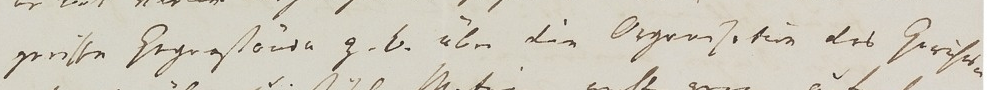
gewisse Gegenstände z. B. über die Organisation des Gerichts-
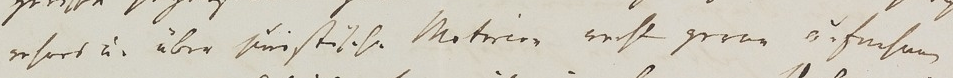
wesensu. über juristische Materien recht gerne aufnehmen
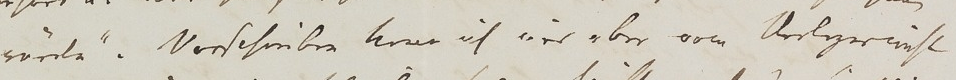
würde». Vorschreiben kann ich mir aber vom Verleger nicht
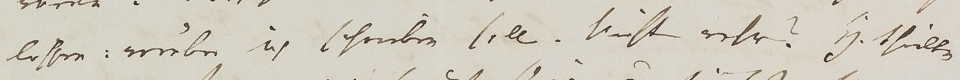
lassen: worüber ich schreiben soll. Nicht wahr? H. theilte
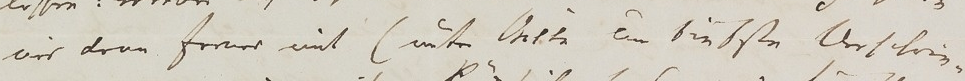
mir dann ferner mit (unter Bitte um tiefste Verschwie-
